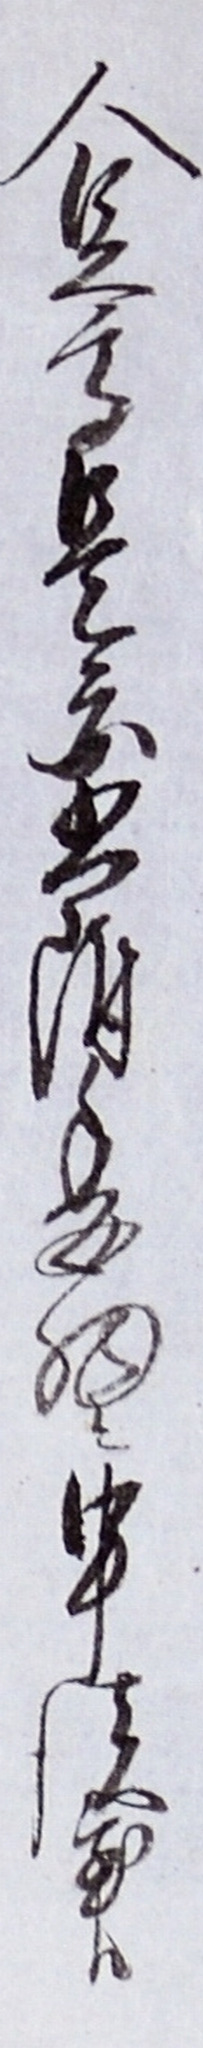人足高是亦書附委細被申談置候
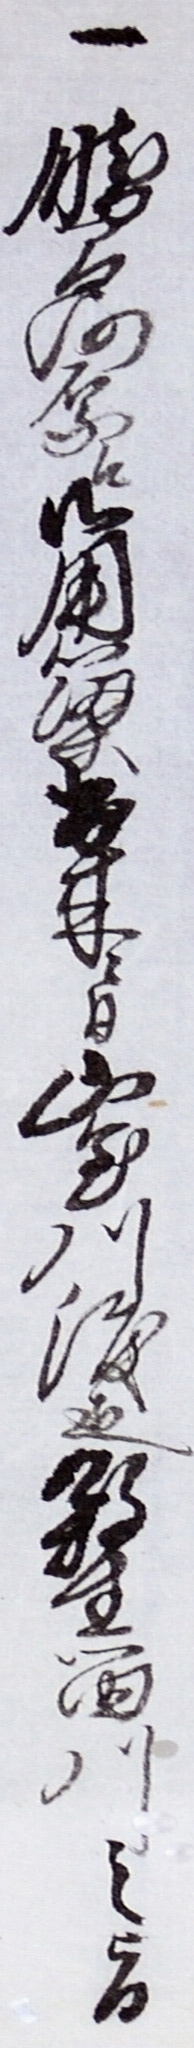一勝間河原江御用簗出来ニ付山室川渡迄殺生留川之旨
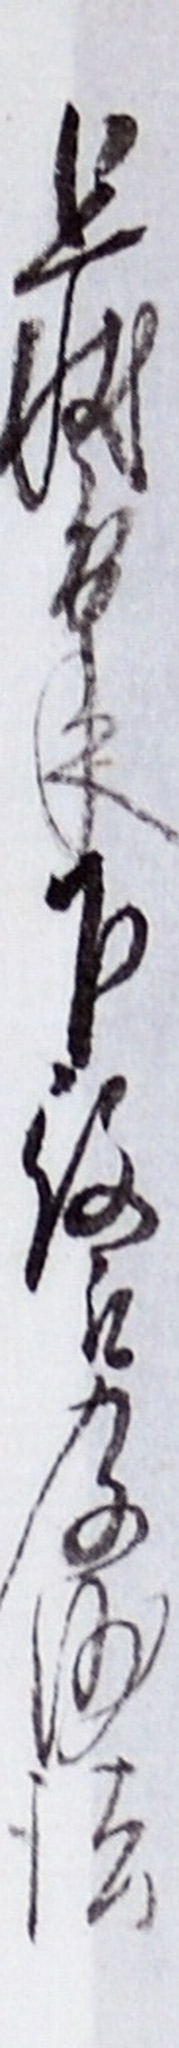廻状到来下役江及沙汰
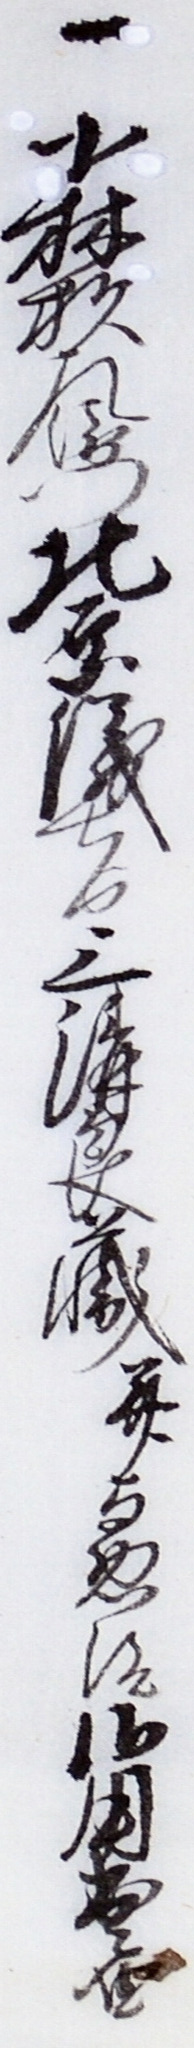一小林杉左衛門北原儀右衛門三溝良蔵并与惣治御用出届
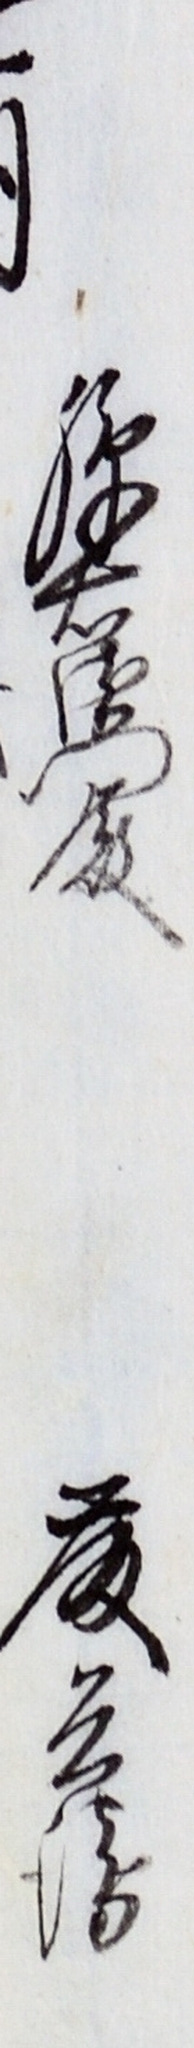孫右衛門殿藤兵衛
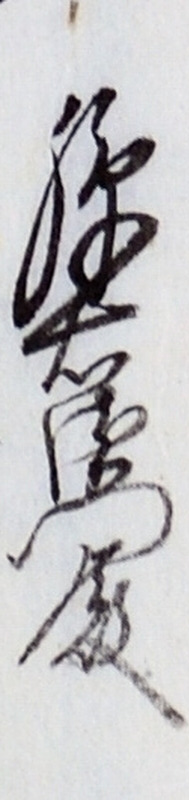藤右衛門殿
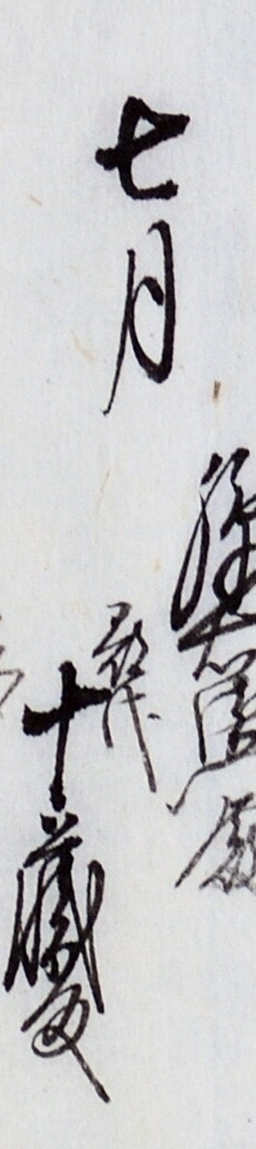七月十蔵殿
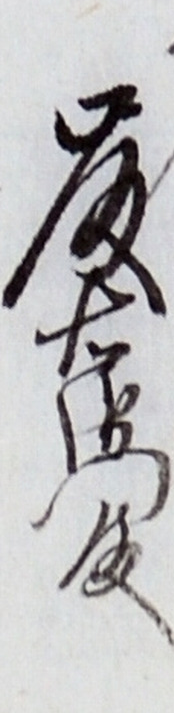藤右衛門殿
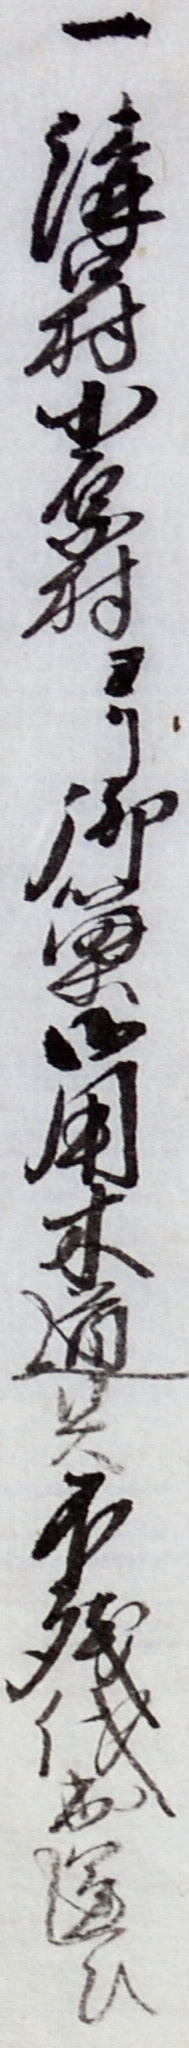一溝口村小原村ヨリ御簗御用木道具不残伐出運ひ
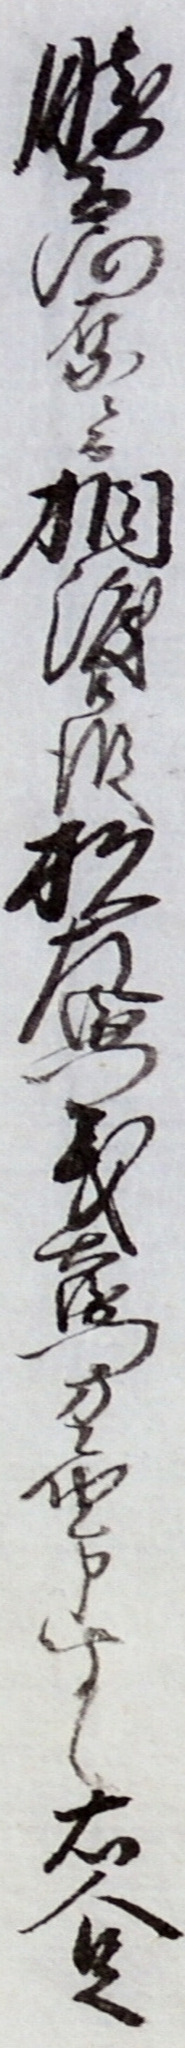勝間河原ニ而相渡候段杉左衛門義右衛門方届申聞候右人足
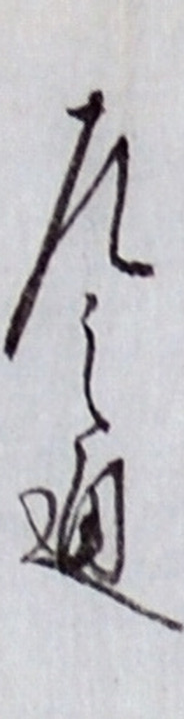左之通
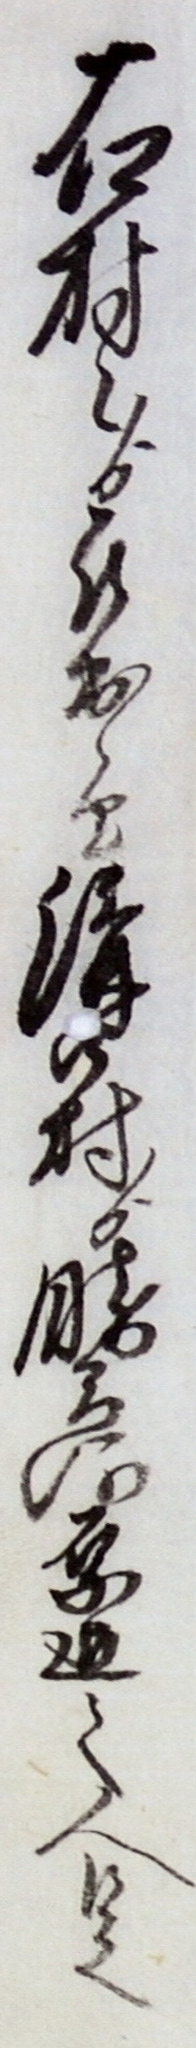右村々より罷出候由溝口村より勝間河原迄之人足

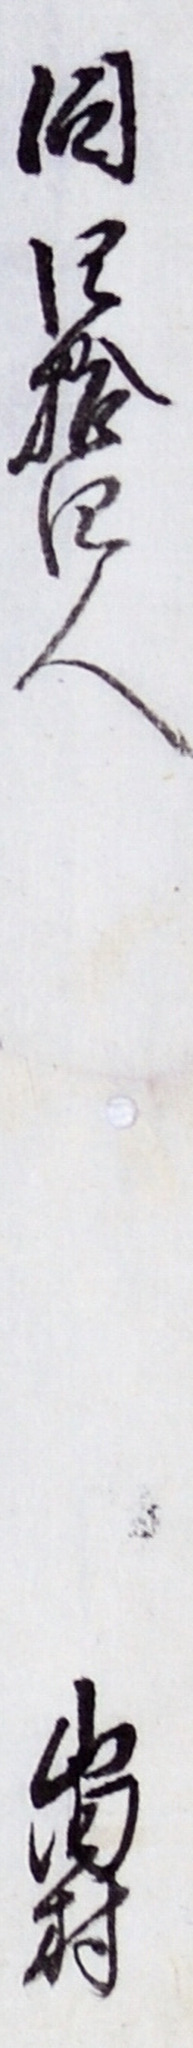同四拾四人山田村
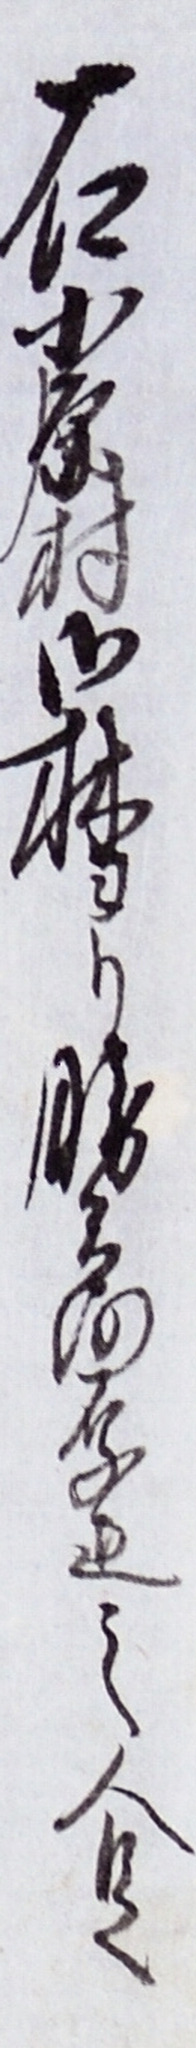右小原村御林ヨリ勝間河原迄之人足
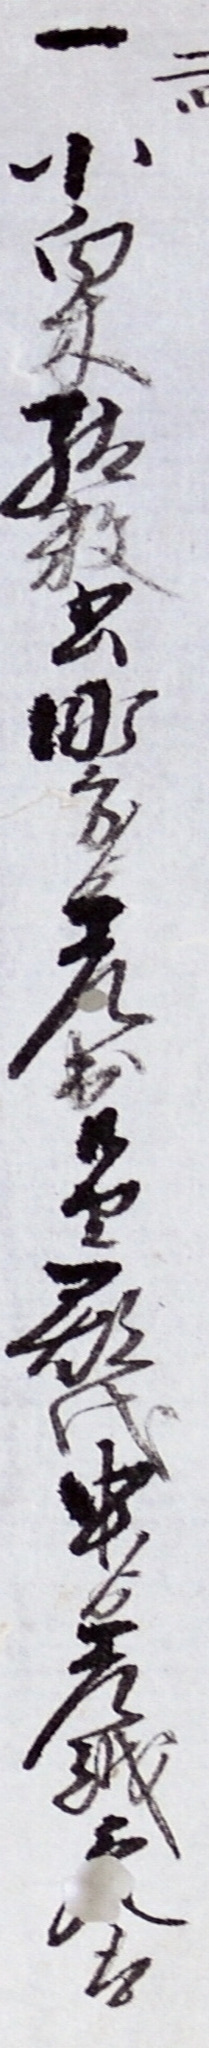一小白木駄数書町方より差出候由郡代中より差越受取
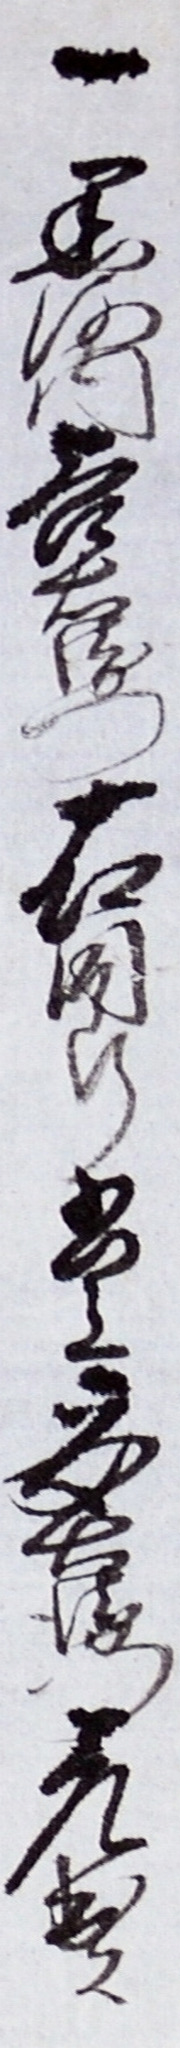一黒河内善右衛門右同断書上安右衛門差出ス
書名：御山奉行御用控
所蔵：伊那市立高遠町図書館・合同会社AMANE
